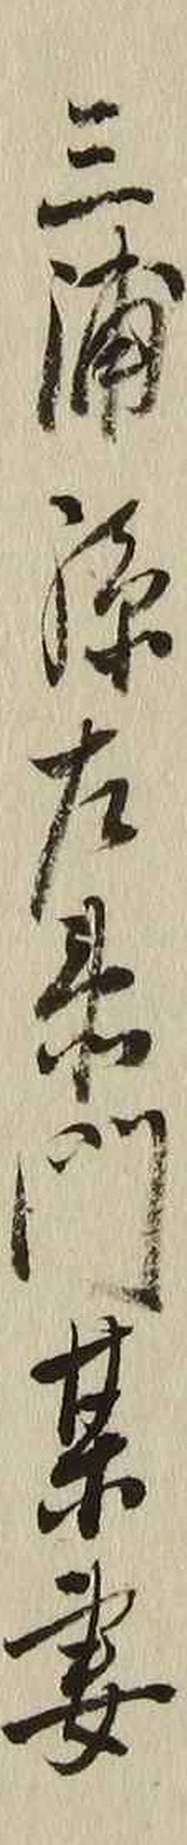女三浦孫左衛門某妻
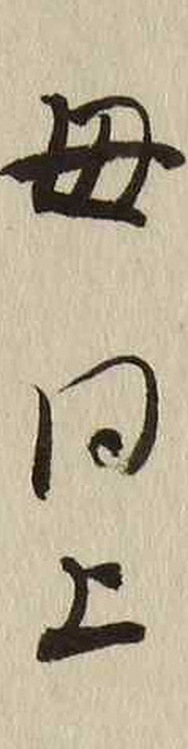母同上
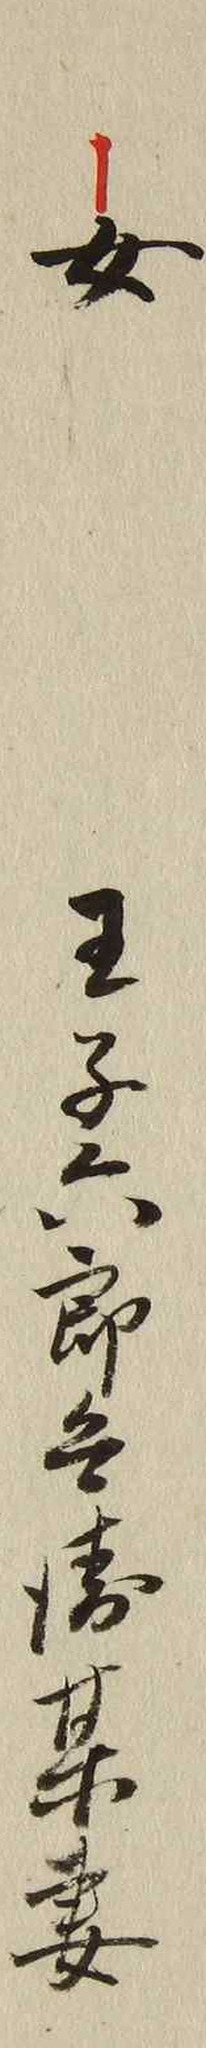女王子六郎兵衛某妻
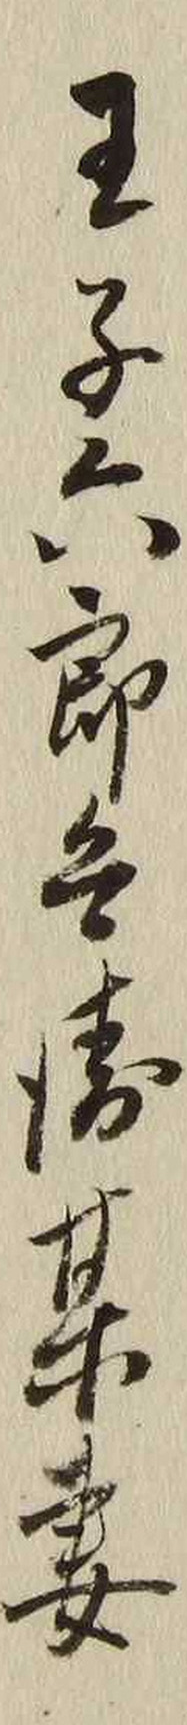女王子六郎兵衛某妻
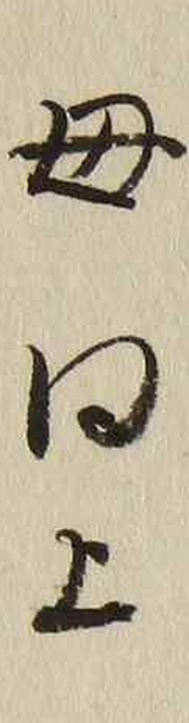母同上
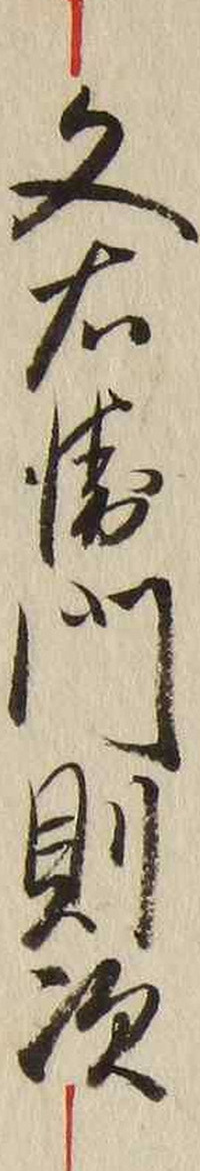文右衛門則次

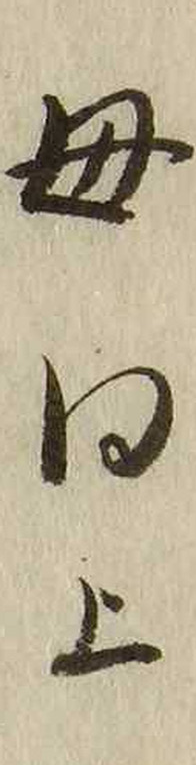母同上
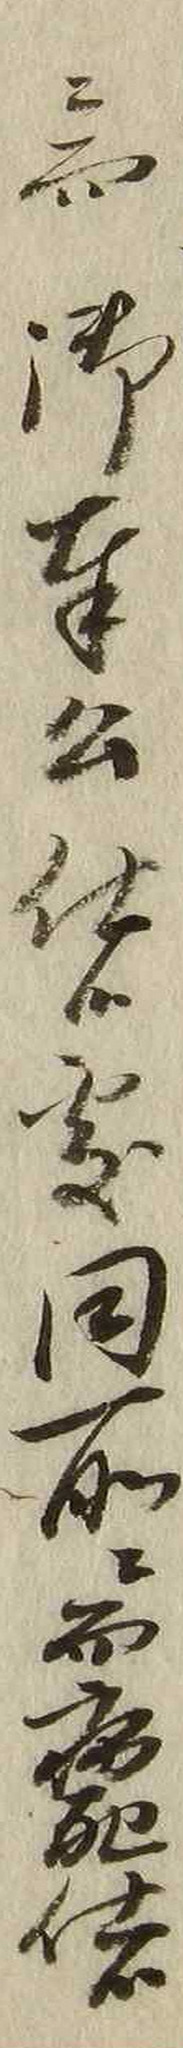ニ而御奉公仕候処同所に而病死仕候
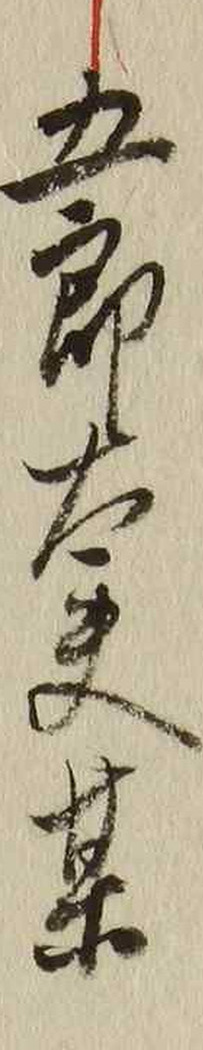五郎太夫某
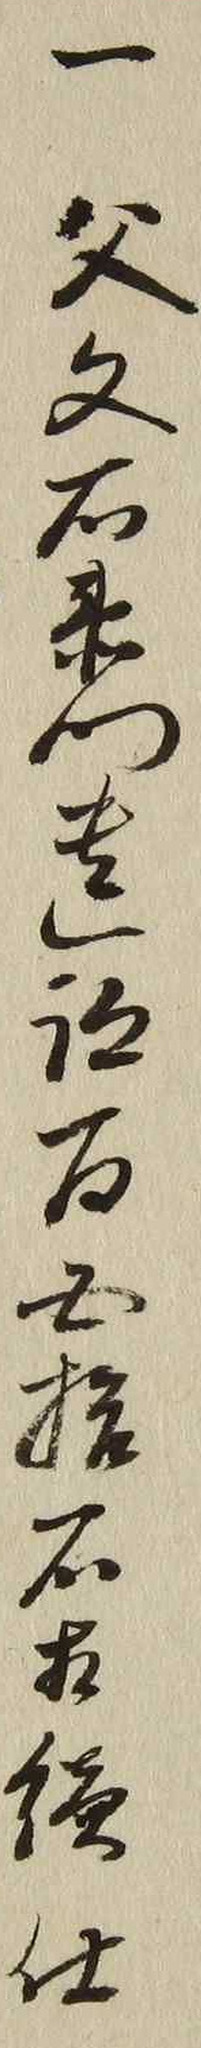一父文石衛門遺跡百五拾石相続仕
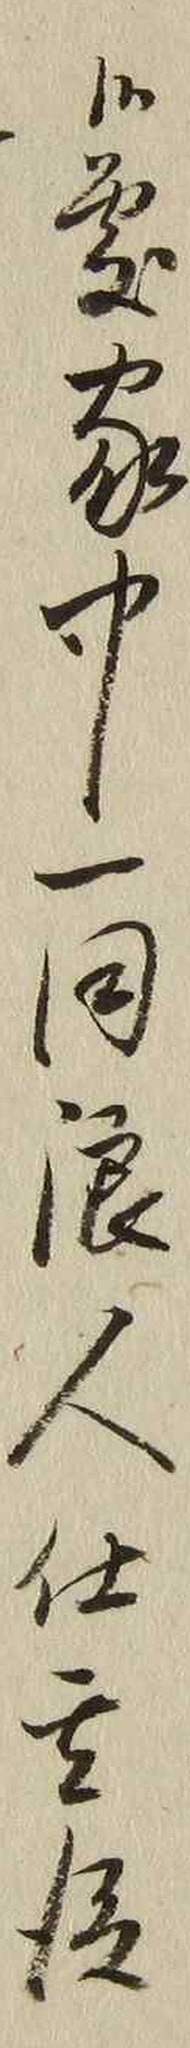候処家中一同浪人仕其後
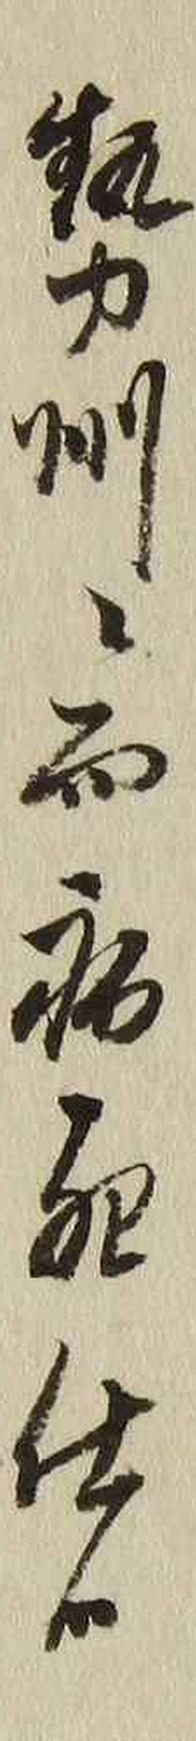勢州ニ而病死仕候
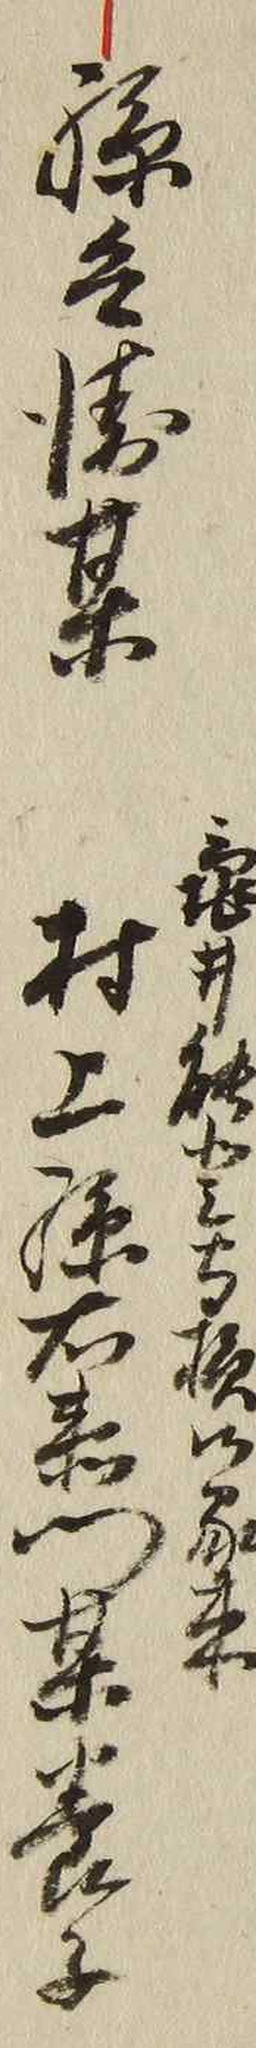孫兵衛某村上孫右衛門某養子

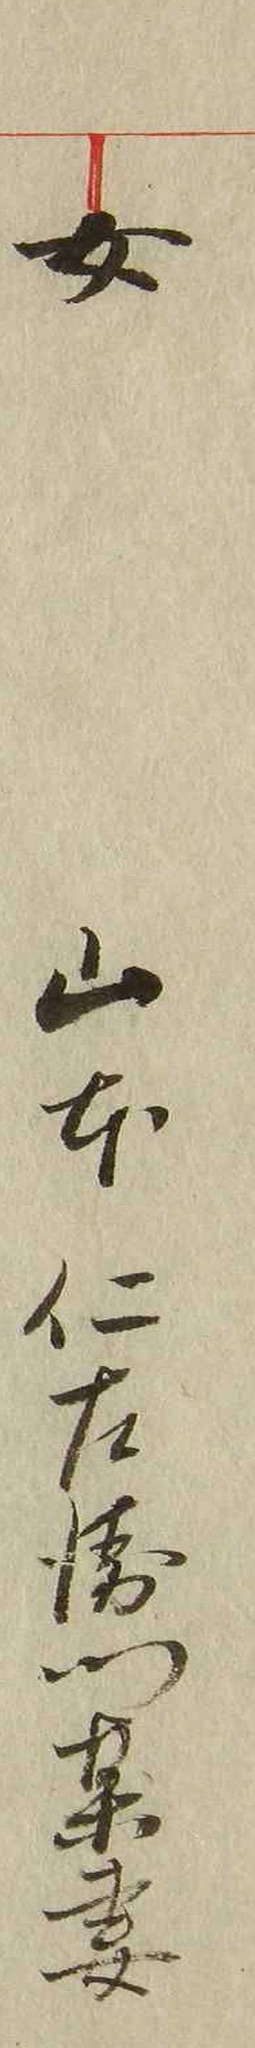女山本仁左衛門某妻
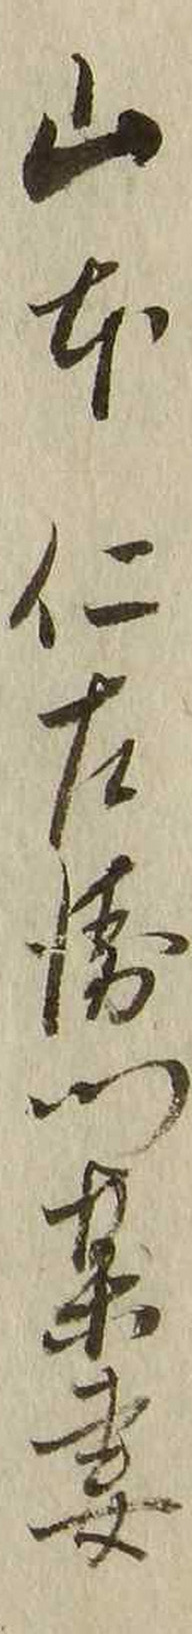女山本仁左衛門某妻
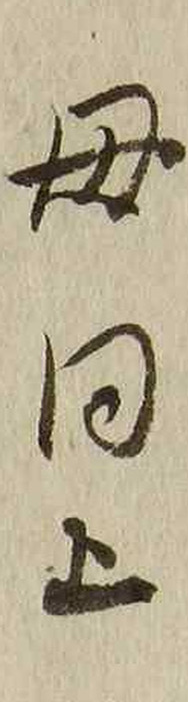母同上
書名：諸士系譜　巻之355　す之部5
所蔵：会津若松市立会津図書館
